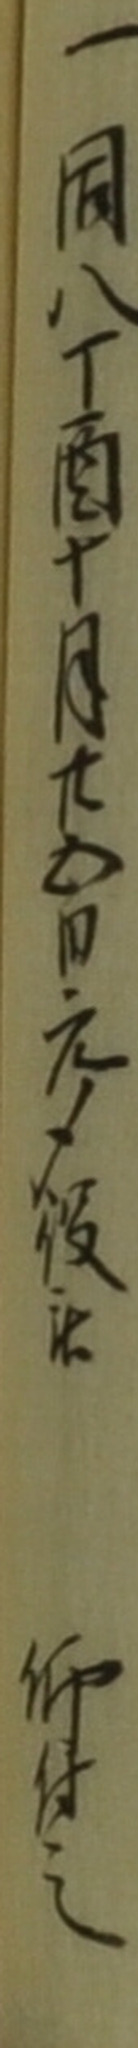一同八丁酉十月廿五日元〆役被仰付之
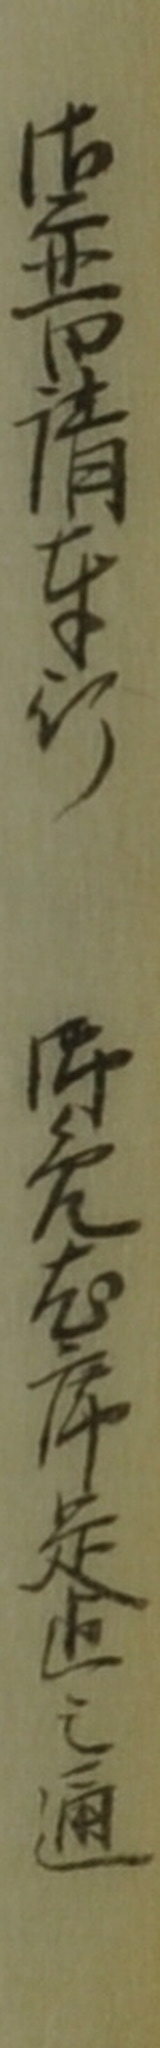御普請奉行御免尤席是迄之通
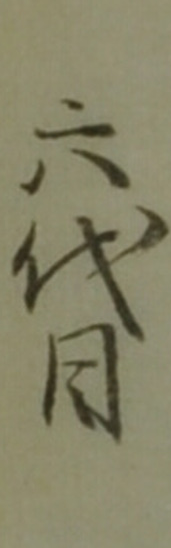六代目
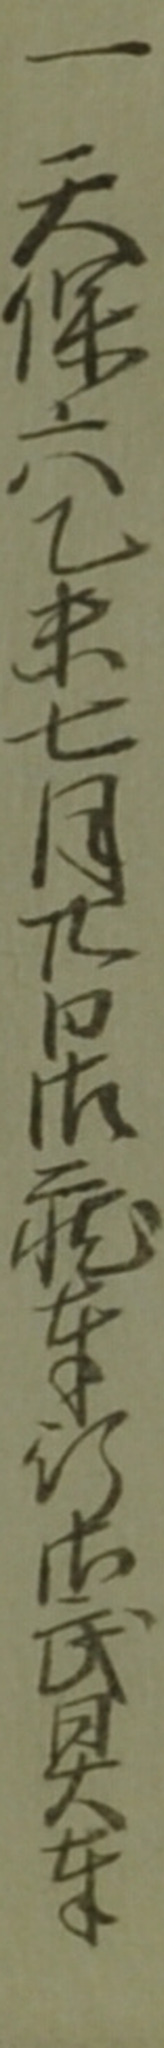一天保六乙未七月廿日御蔵奉行御武具奉
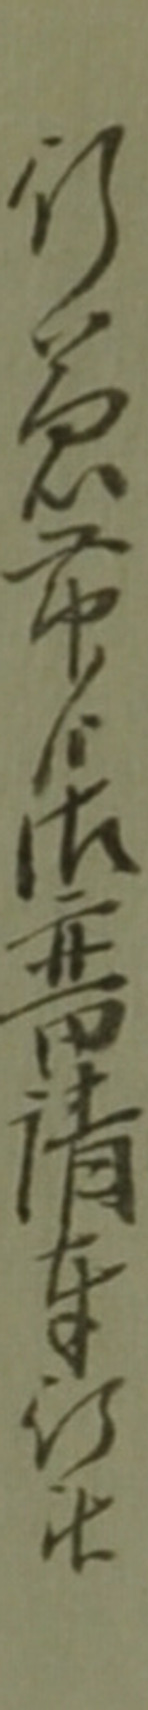行兼帯ゟ御普請奉行被
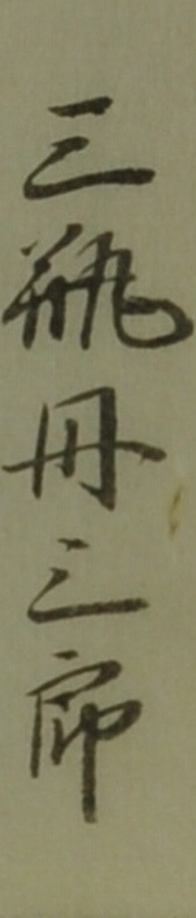三瓶丹三郎
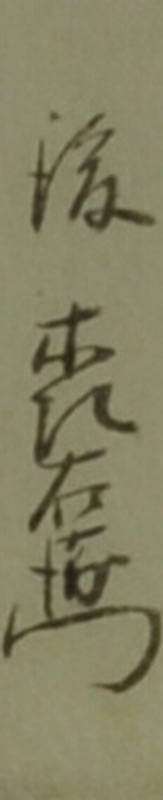後森右衛門
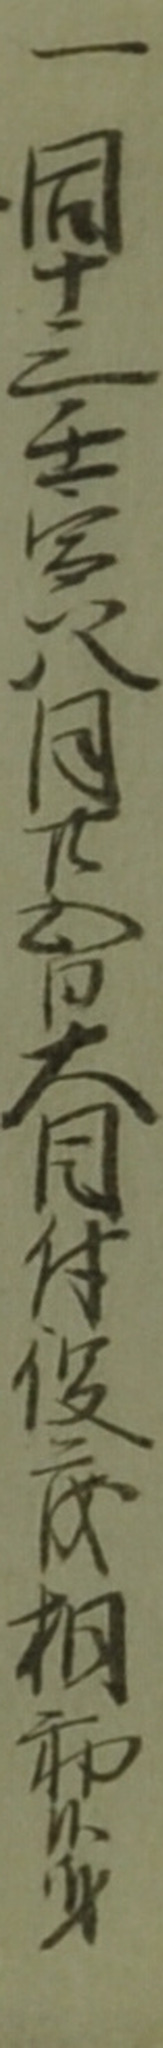一同十三壬寅八月廿五日大目付役茂相勤候身
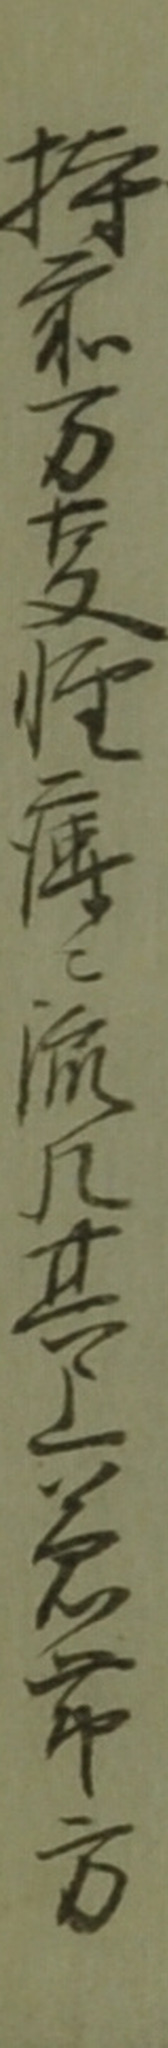持前方事軽痺ニ流几其上兼帯方
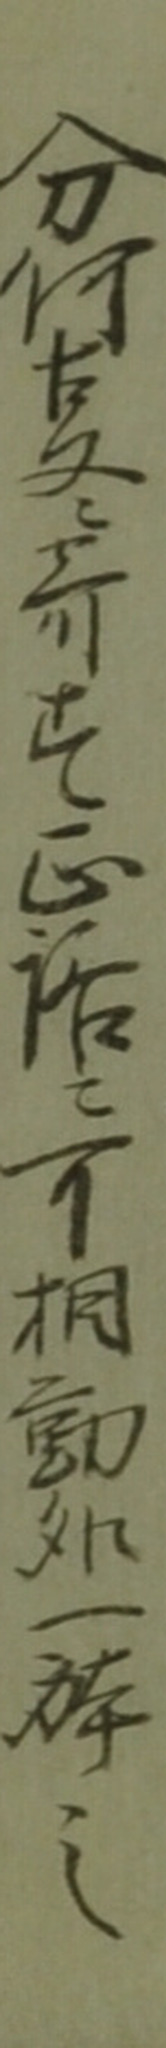分何事ニ奇す正話ニ可相勤処一群之
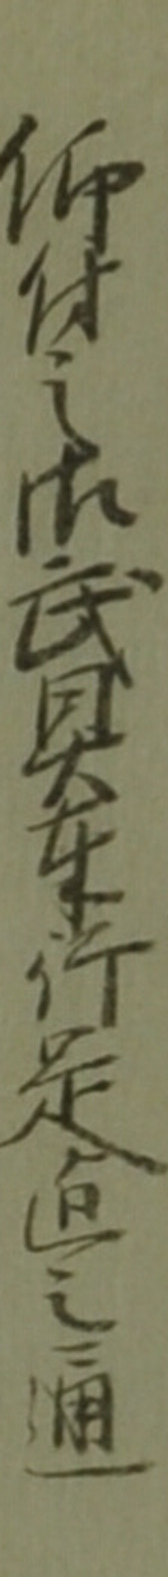仰付之御武具奉行是迄之通
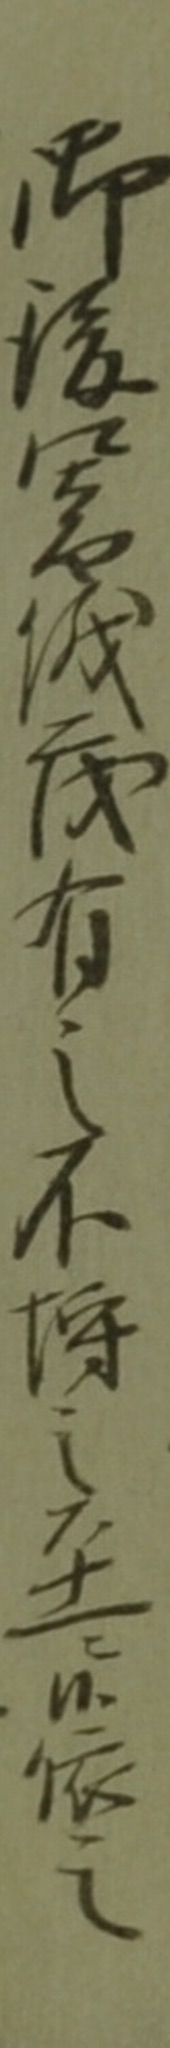御後◻︎儀茂有之不埒之至ニ候依之
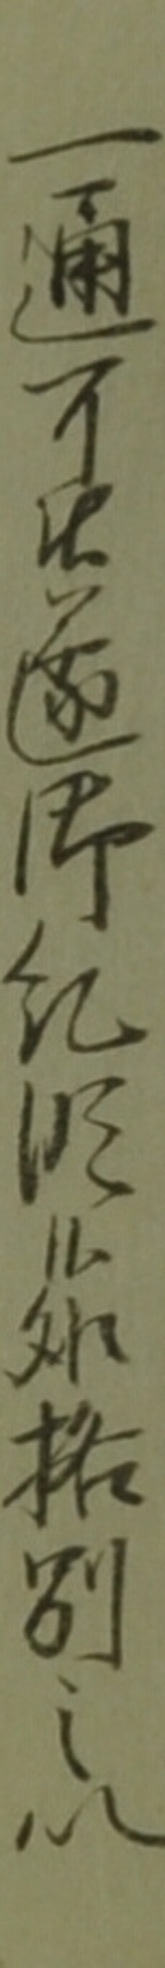一通可被遂御飢段候処格別之以
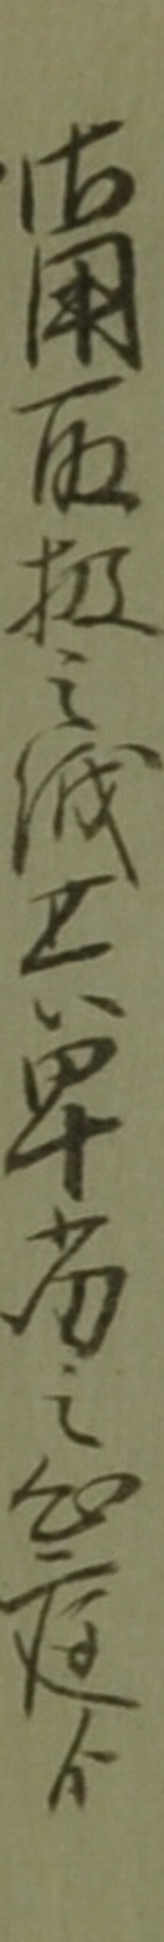御用取扱之儀共卑劣之心庭ゟ
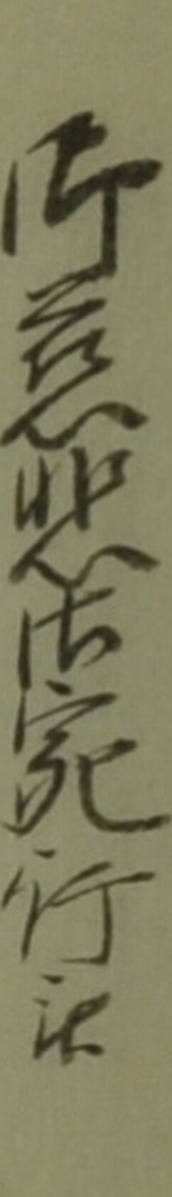御慈悲御宛行被
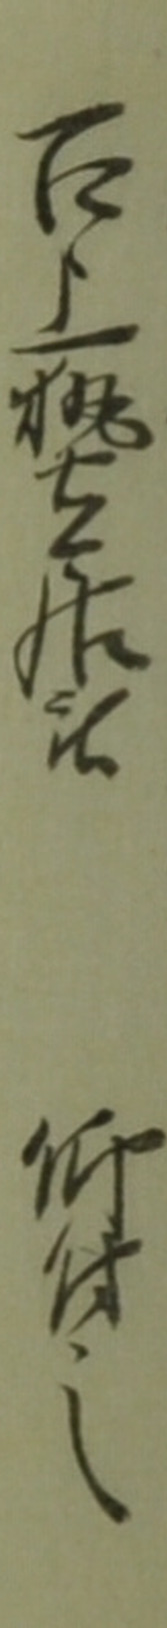召上蟄居被仰付之
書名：諸御役代々録（六）
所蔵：伊那市立高遠町図書館・合同会社AMANE
